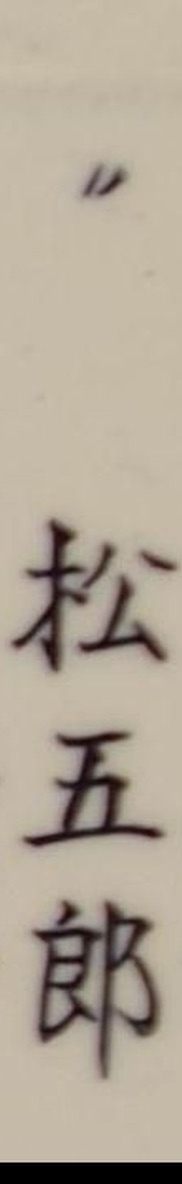松五郎
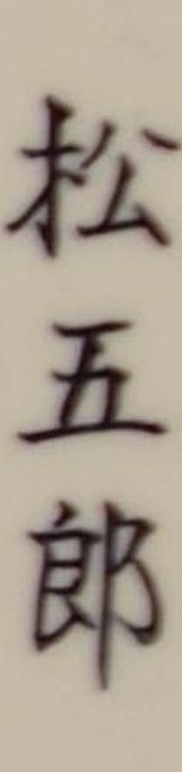松五郎
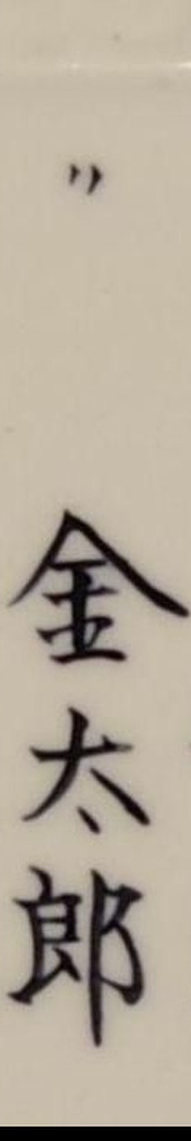金太郎
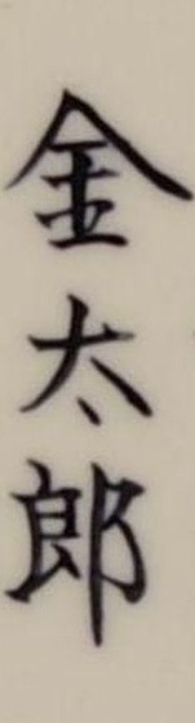金太郎
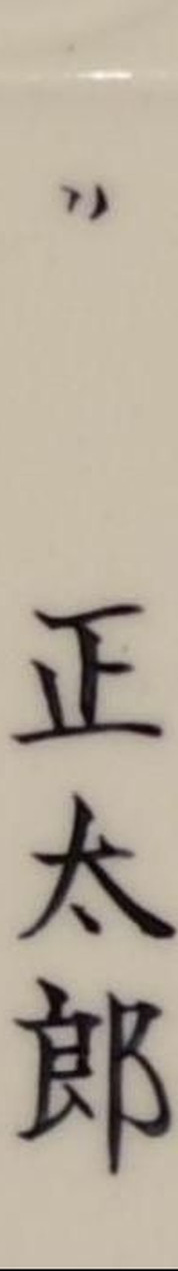正太郎
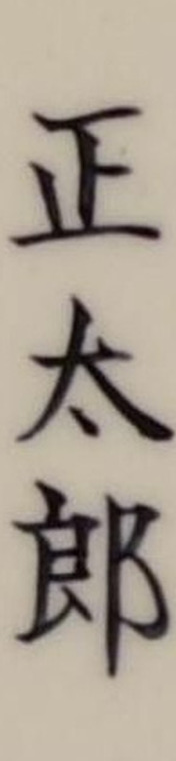正太郎
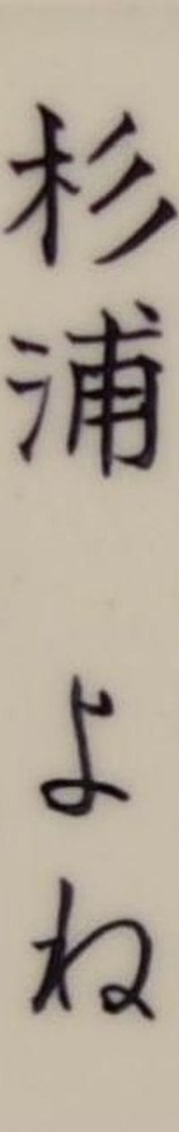杉浦よね
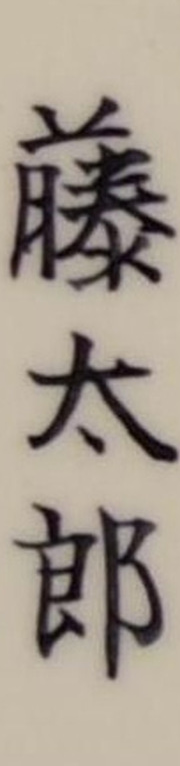藤太郎
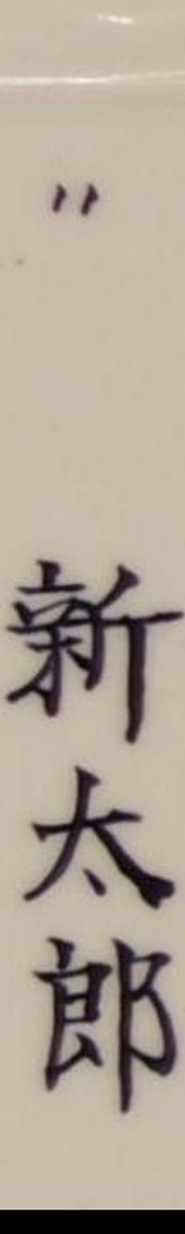新太郎
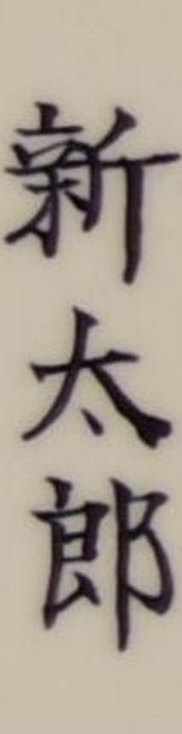新太郎

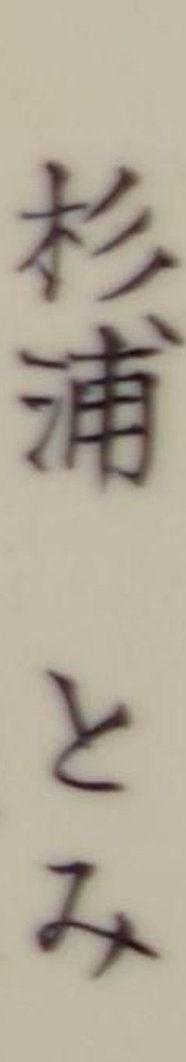杉浦とみ
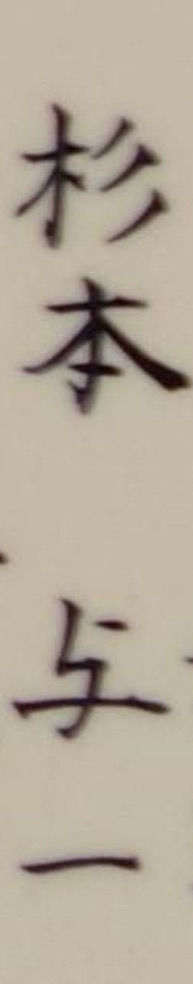杉本与一
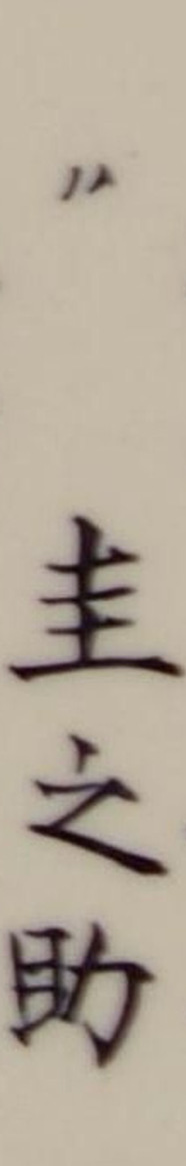圭之助
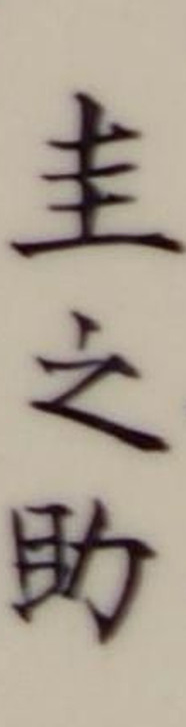圭之助
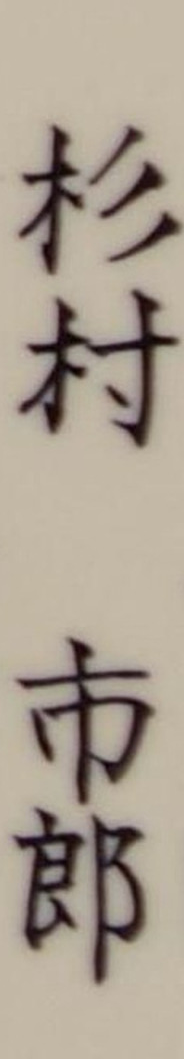杉村市郎
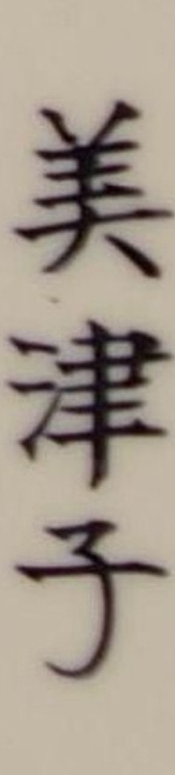美津子
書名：M~S
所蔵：高野山金剛峯寺
